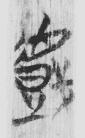戲
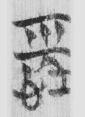{心㸒}
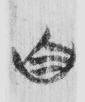自
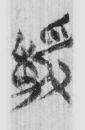嘉
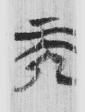而
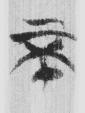不
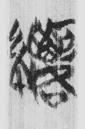縷
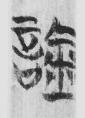{言金}
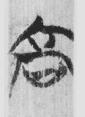高
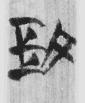玟
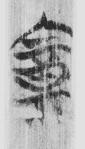{富示}
